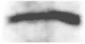一
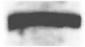一
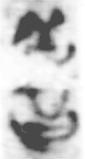晉
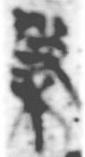杸
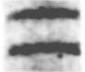二
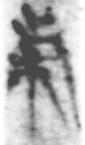旆
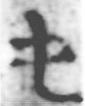屯
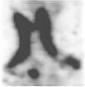八
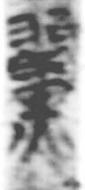翼
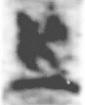之
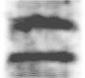二
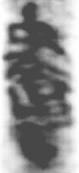○（畫）
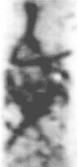○（伐）
